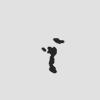甘
